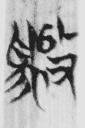{爲攴}
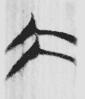大
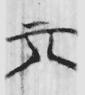亓
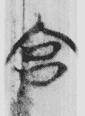宮
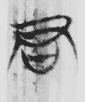君
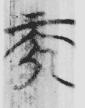而
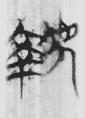{幸虎}
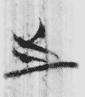之
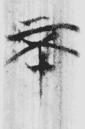不
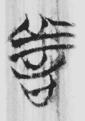善
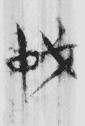{戈才}
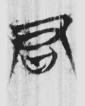君
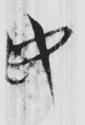女
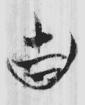由
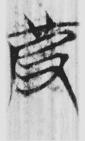皮
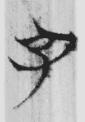孔
